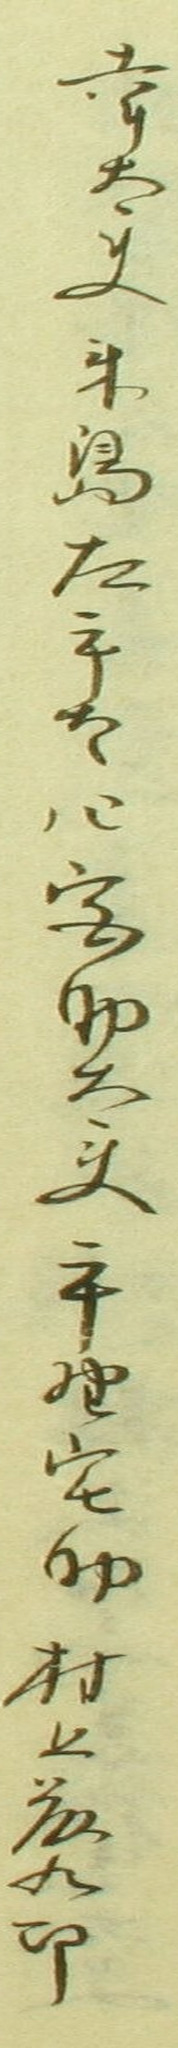幸太夫来島左平太四宮助太夫平野宅助村上藤九郎
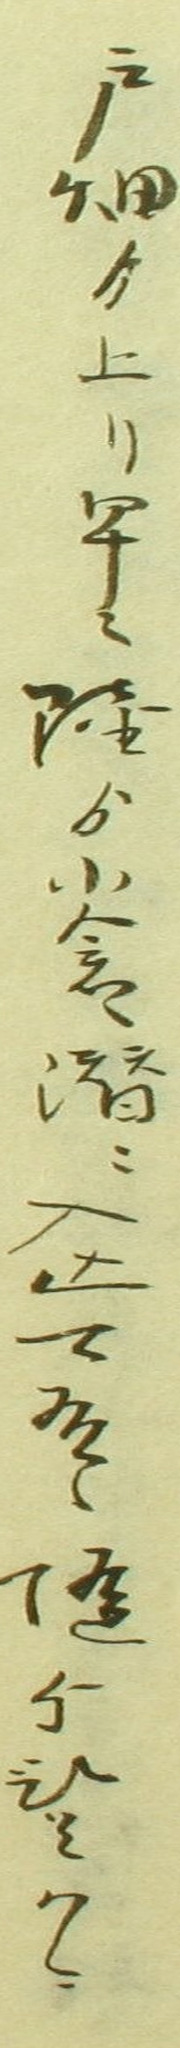戸畑ゟ上り早々陸ゟ小倉へ潜ニ入込可有之随分ひそかに
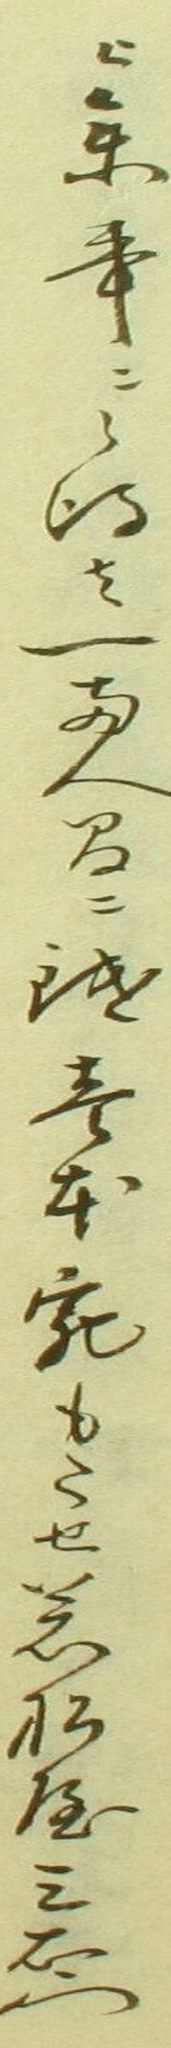被参事に候得は一両人間ニ鑓壱本宛もたせ若松屋三右衛門
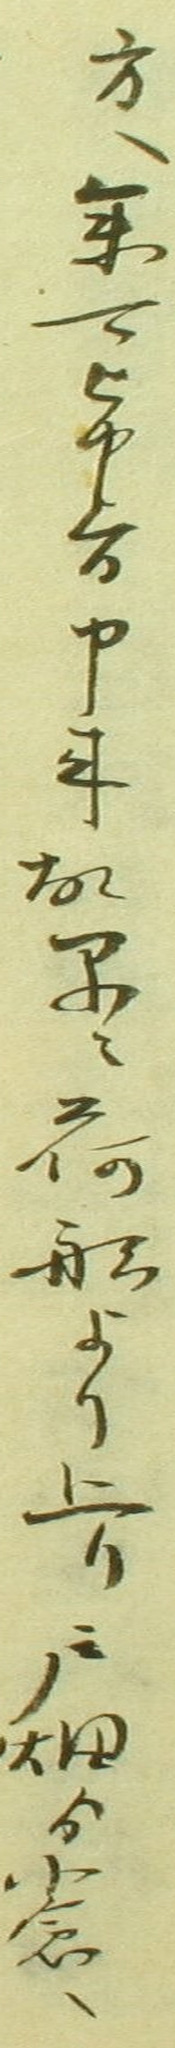方へ参可被申旨申来故早々荷船より上り戸畑ゟ小倉へ
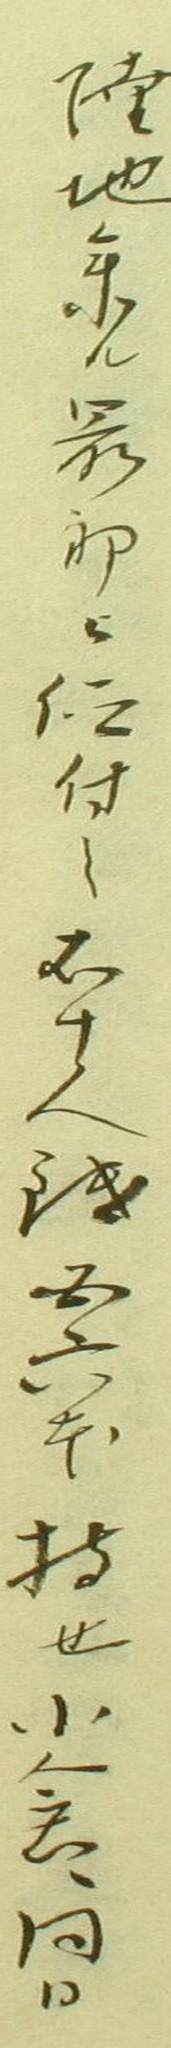陸地参ル最初被仰付候右十人鑓五六本持せ小倉へ同日
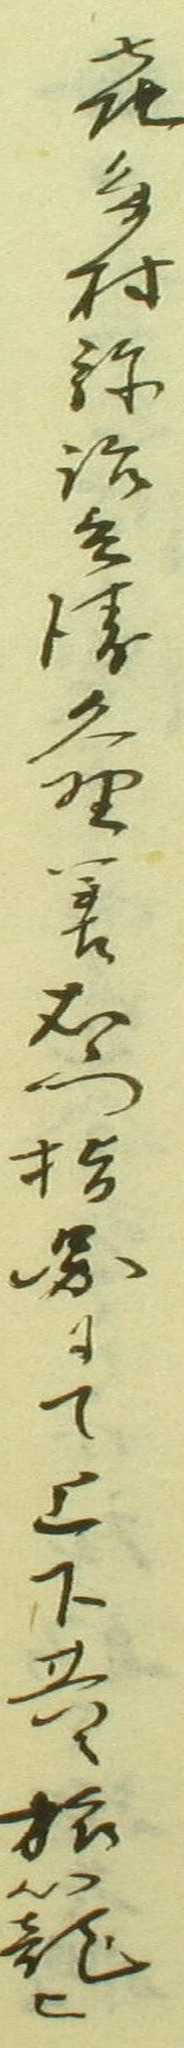喜多村弥治兵衛久野善右衛門指図にて上下共々旅籠被
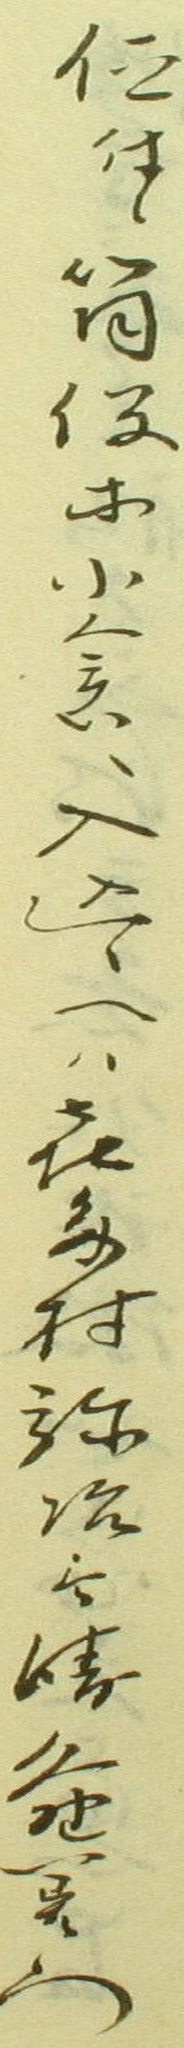仰付候筒役等小倉へ入込候へは喜多村弥治兵衛久野善右衛門
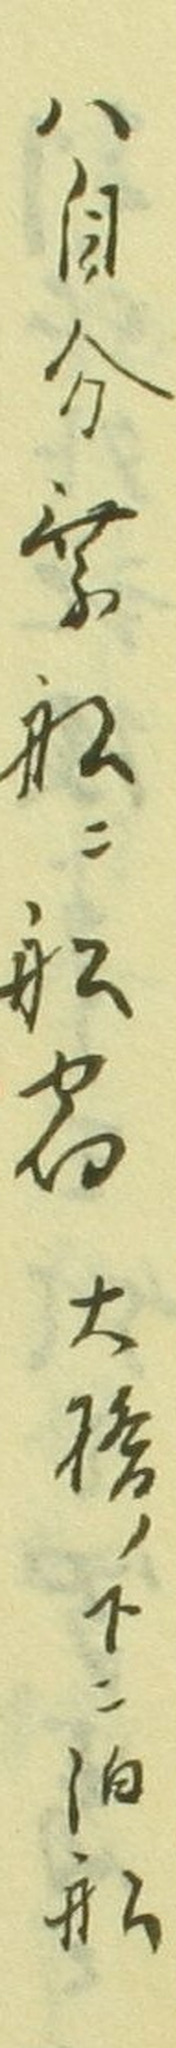ハ自分乗船ニ船宿大橋ノ下ニ泊船
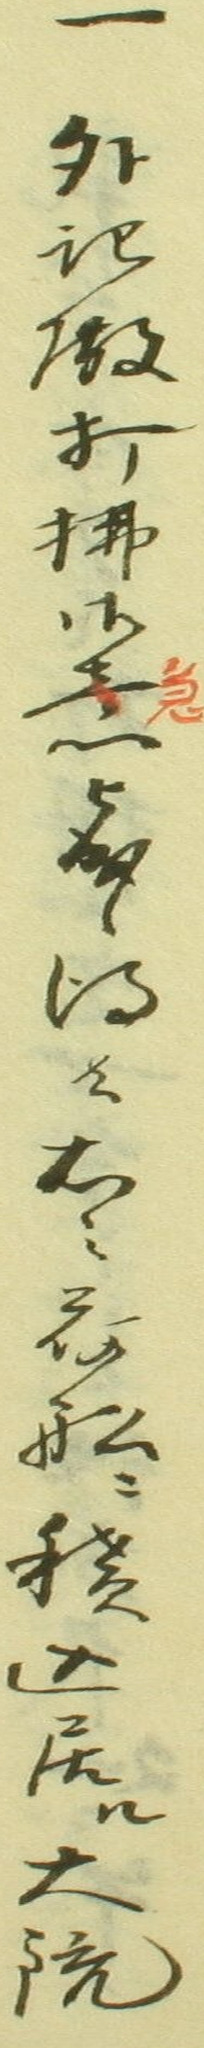一外記殿打払御急被成候得は右之荷船ニ積込居ル大銃
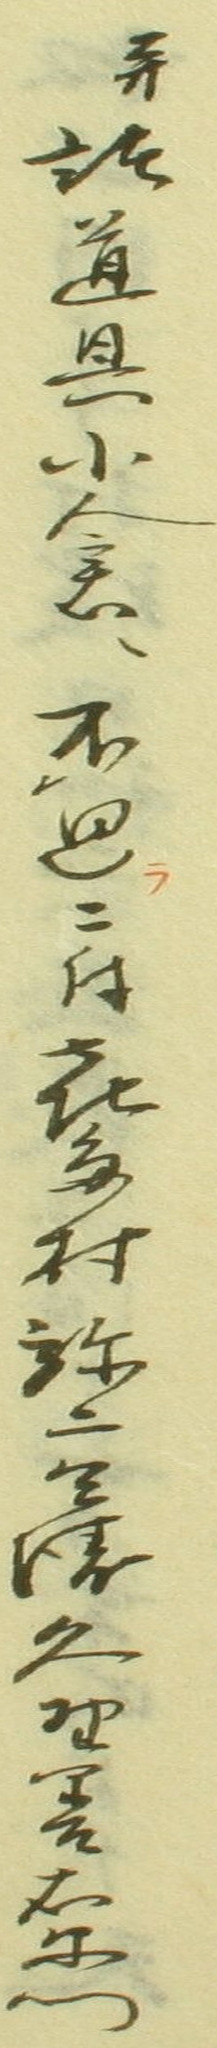幷諸道具小倉へ不廻ニ付喜多村弥次兵衛久野善右衛門
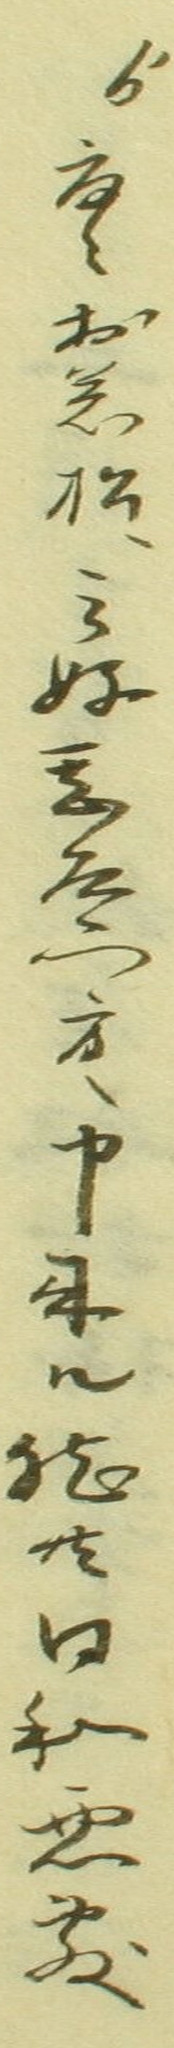ゟ度々於若松へ三好甚左衛門方へ申来ル然共日和悪敷
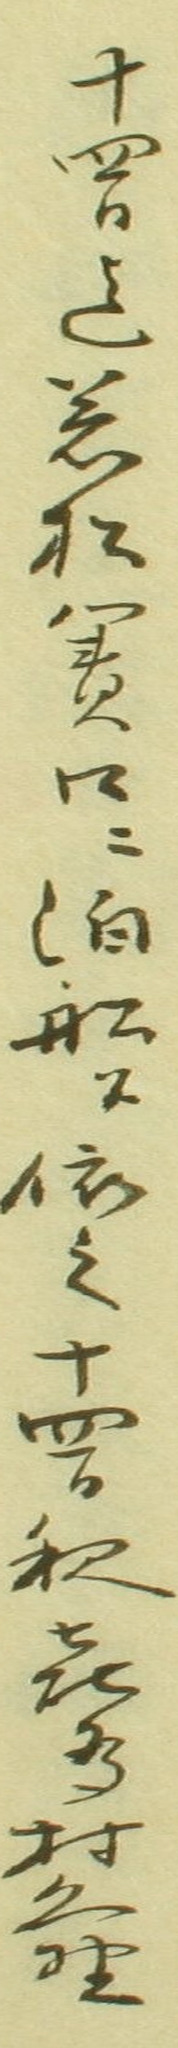十四日迄若松簀口に泊船ス依之十四日夜喜多村久野
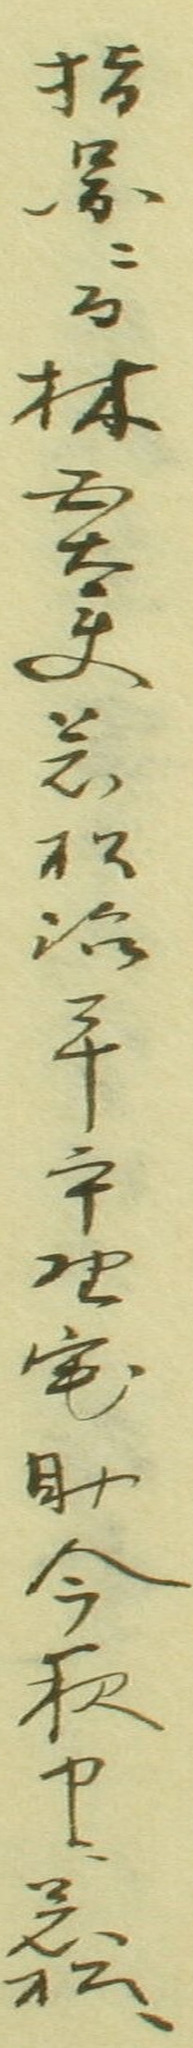指図ニ而林五太夫若松治平平野宅助今夜中ニ若松へ
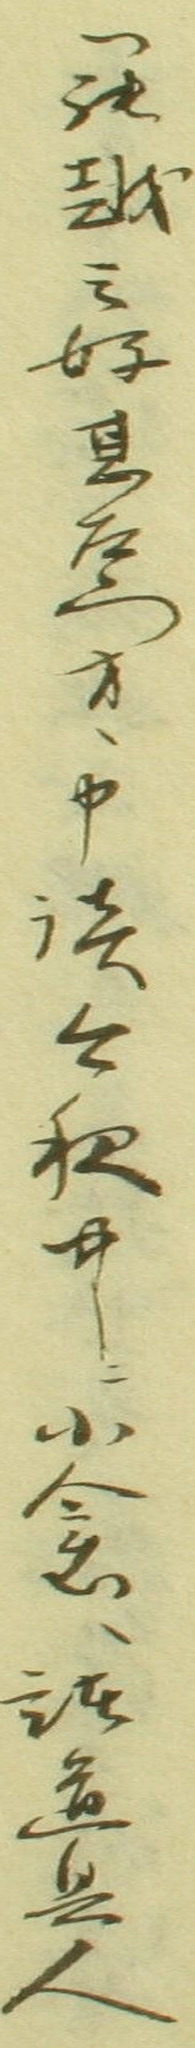罷越三好甚左衛門方へ申談今夜中ニ小倉へ諸道具人
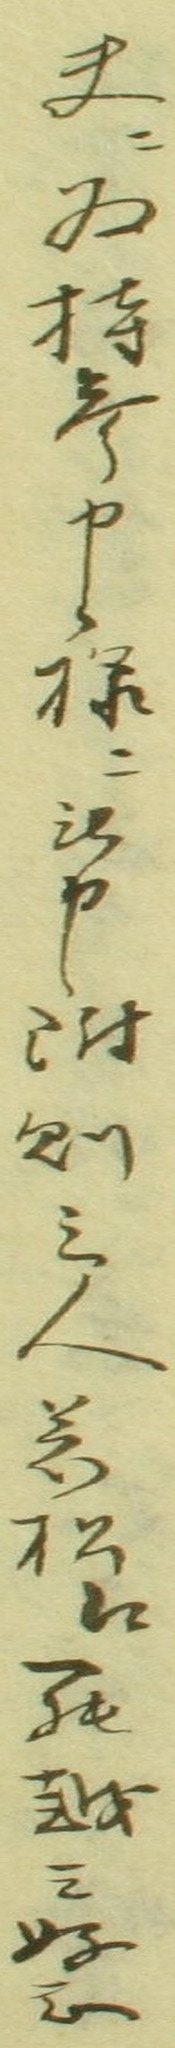夫ニ為持参申候様ニ被申附則三人若松江罷越三好甚
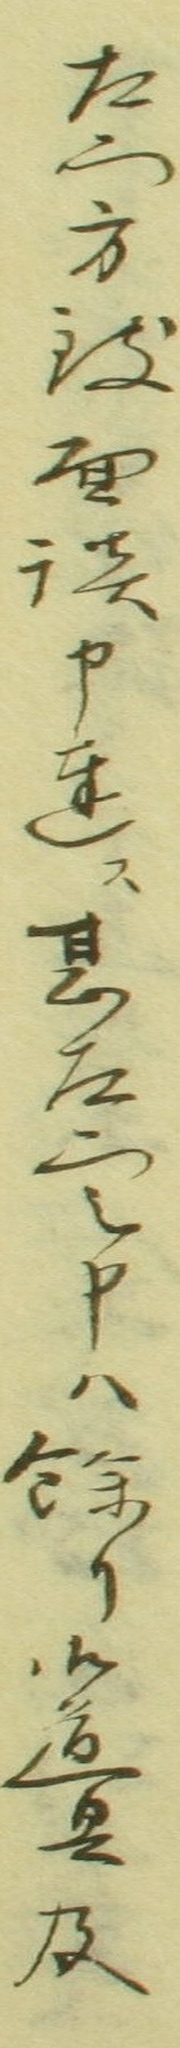左衛門方致面談申達ス甚左衛門之申は余り御道具及
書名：唐船漂流記 二
